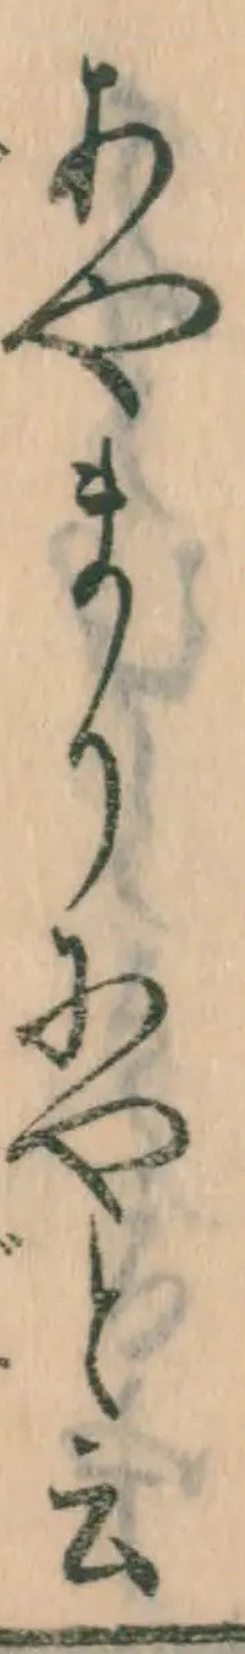あやまりにやと云
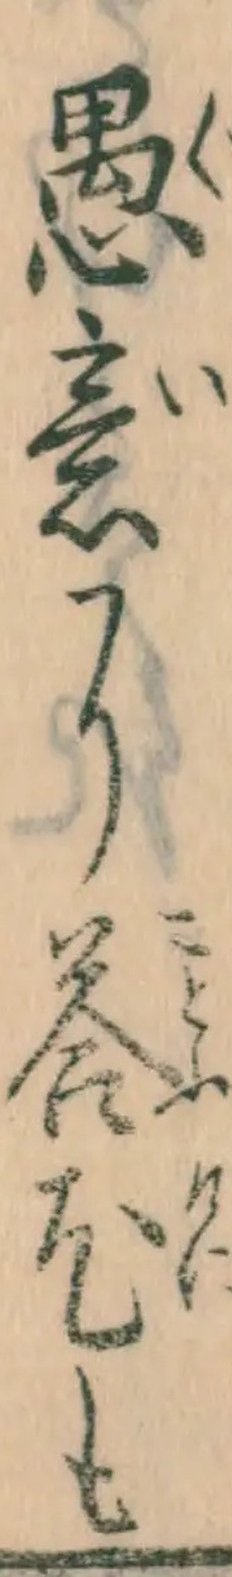愚意に答尤も
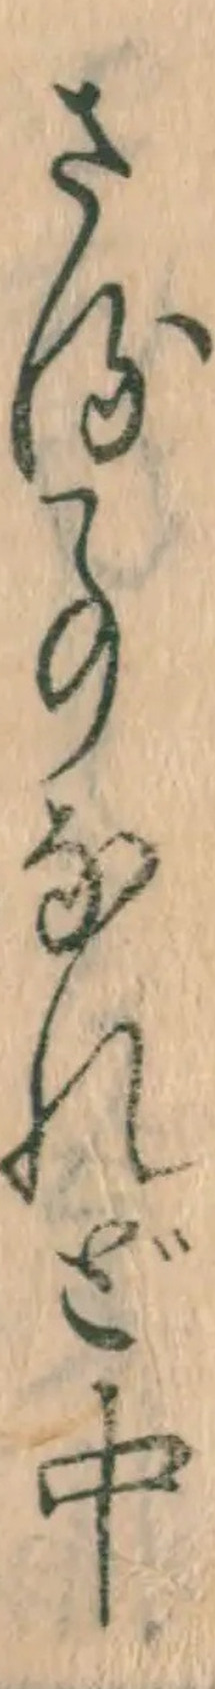さる事なれど中
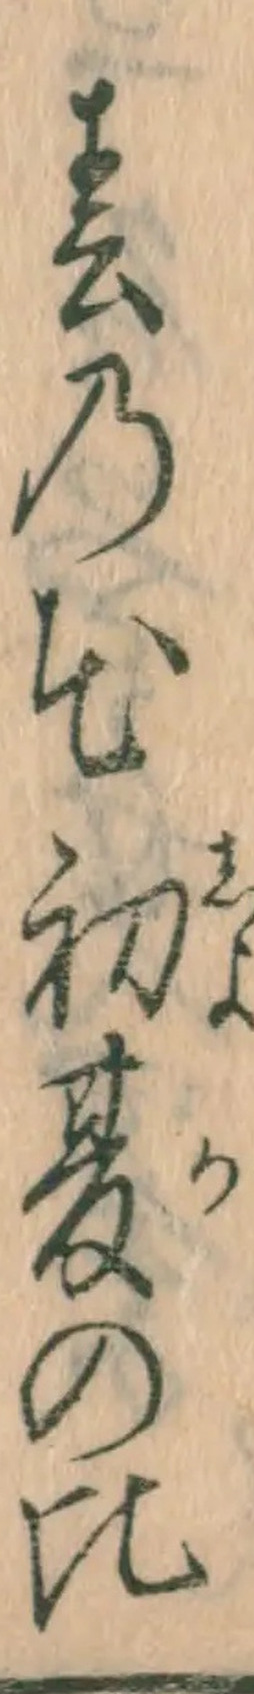春の花初夏の頃
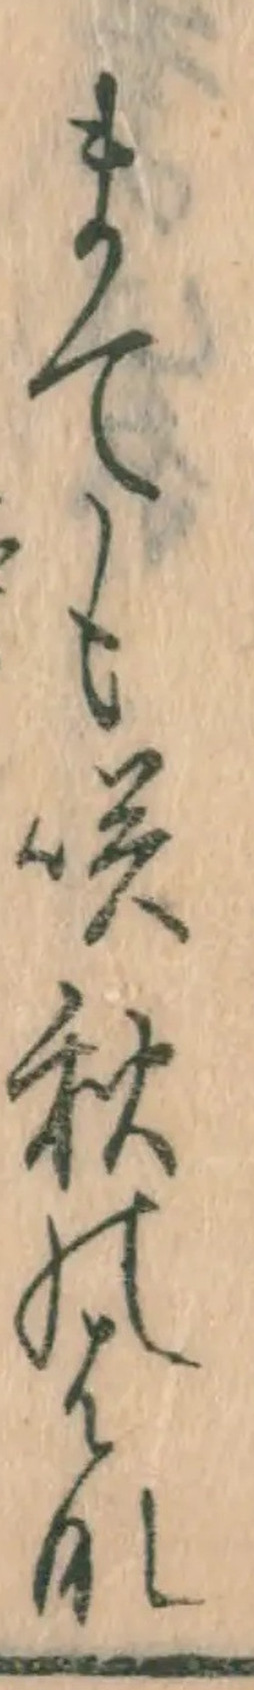まても咲秋のはな
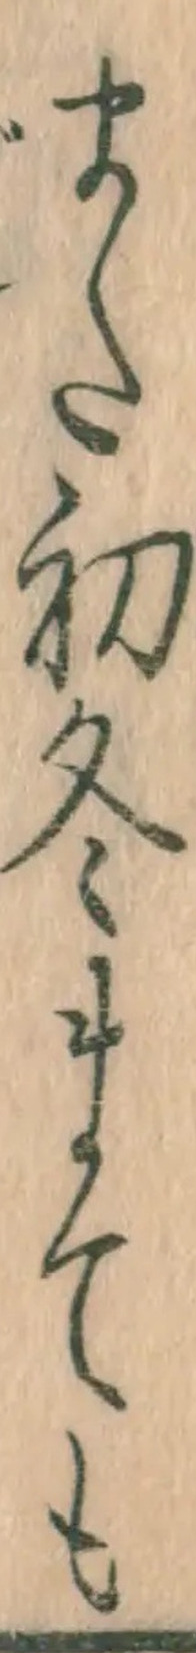また初冬まても
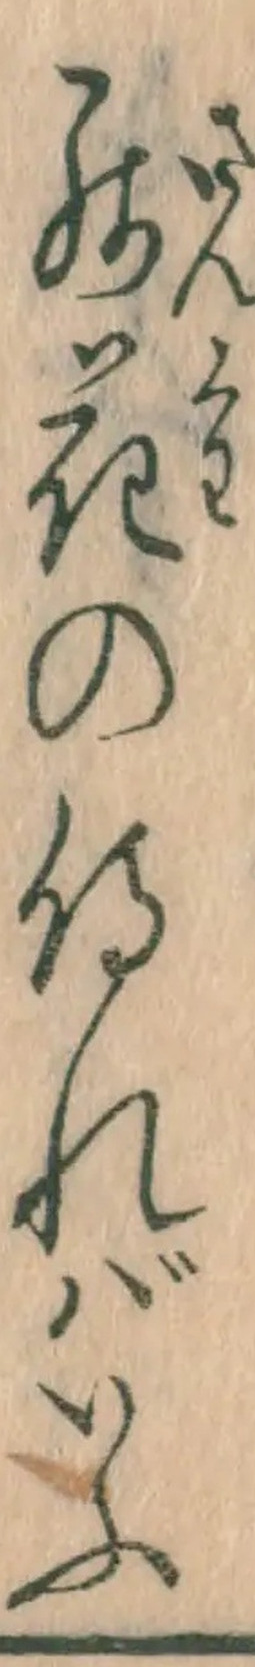残花の侍ればいふ
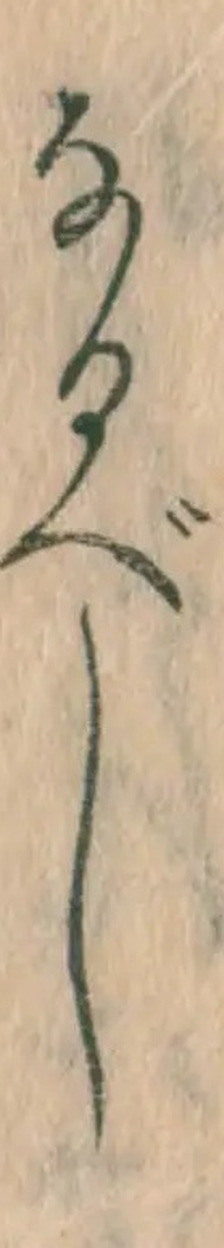なるべし
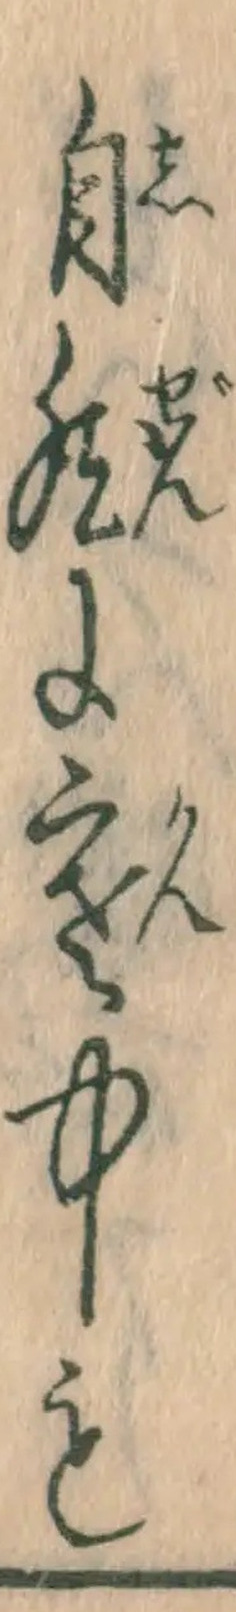自然に寒中も

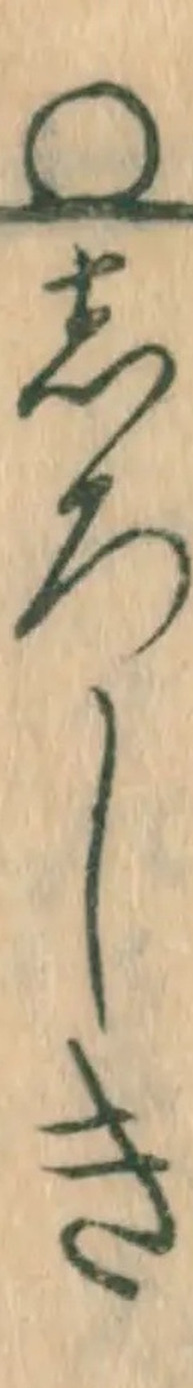○しろしき
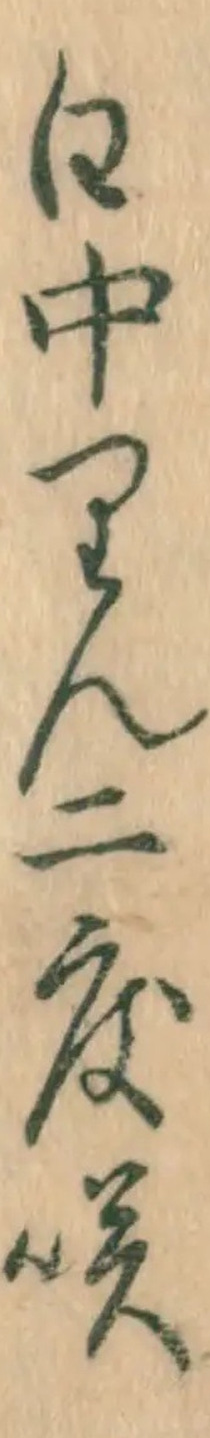白中りん二度咲
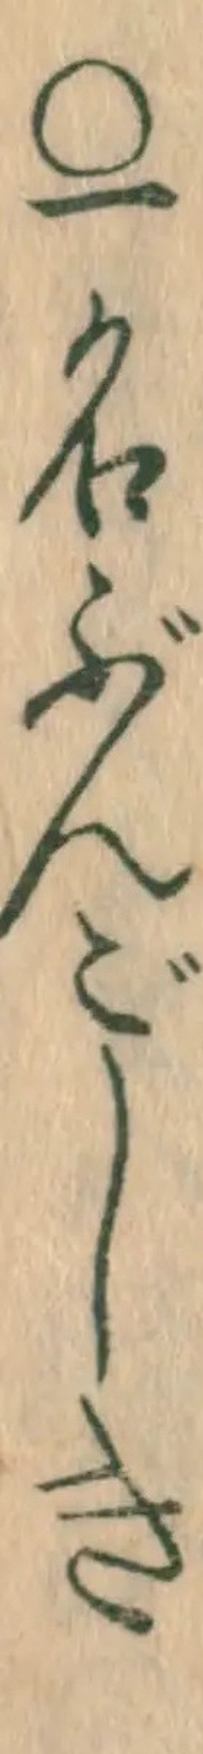○一名ぶんごしき
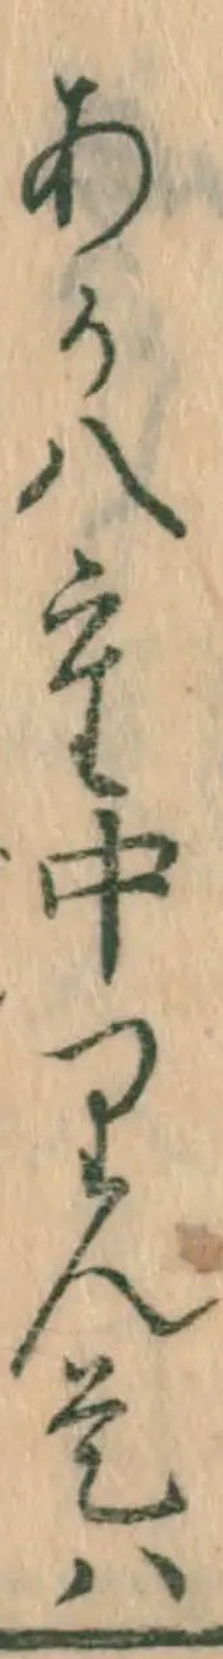あか八重中りん是は
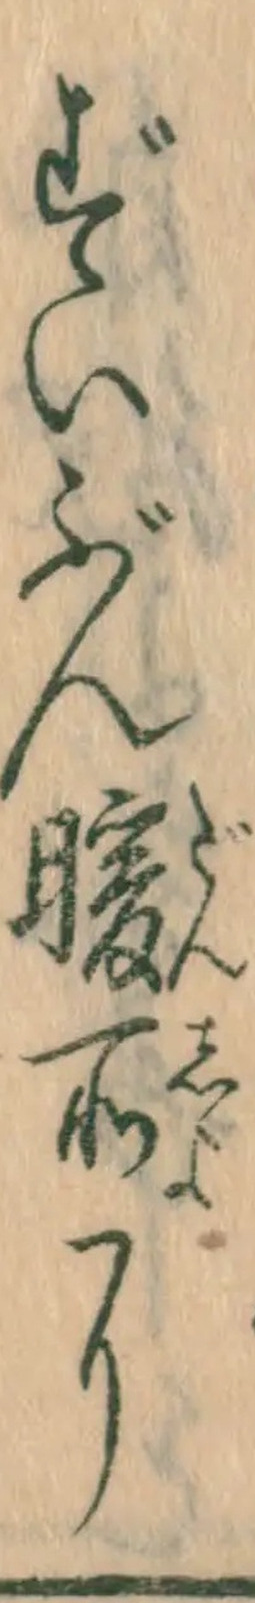ずいぶん暖所に
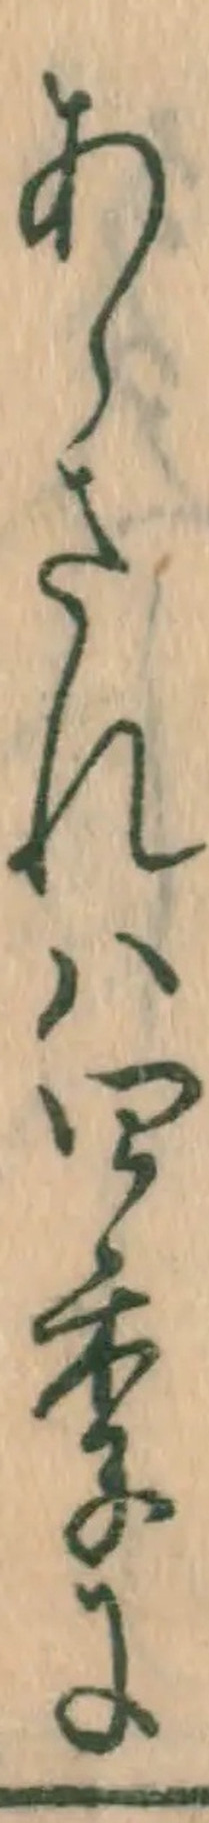あらされは四季に
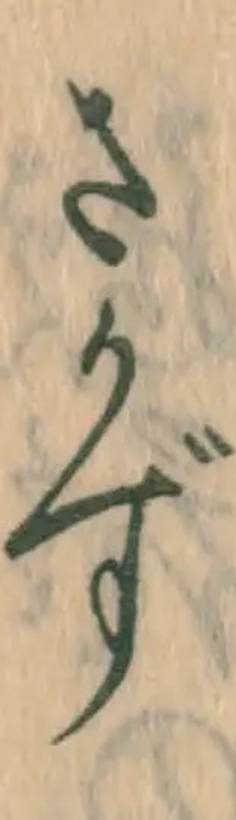さかず
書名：錦繍枕 5巻. [2]
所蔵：国立国会図書館 National Diet Library, JAPAN
